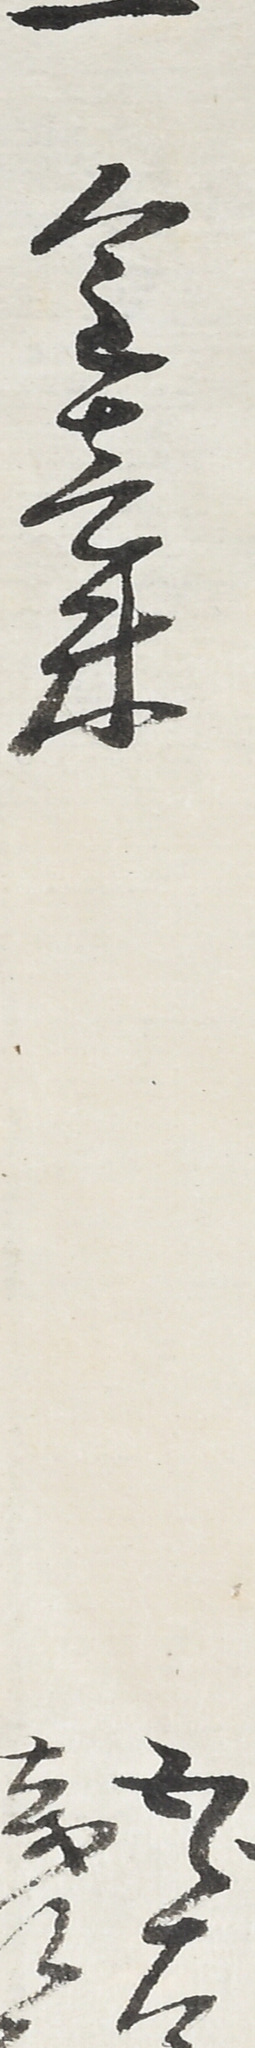一金壱朱又蔵
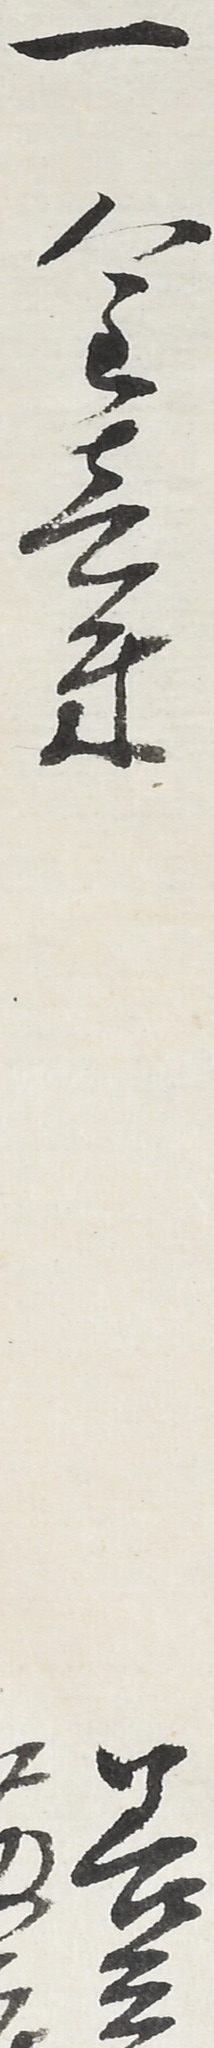一金壱朱善兵衛

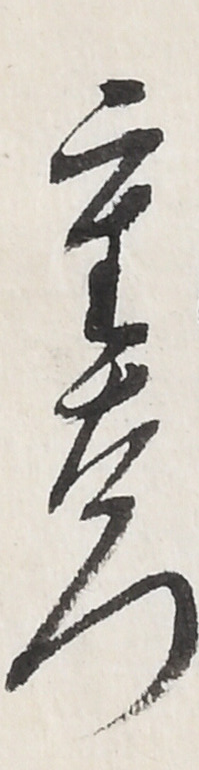重右衛門
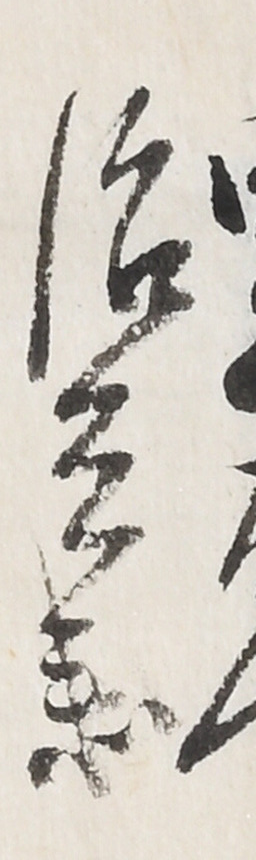治兵衛
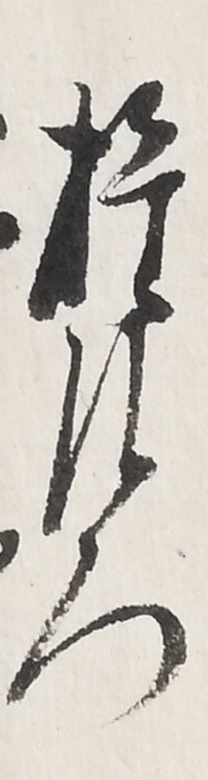吉左衛門
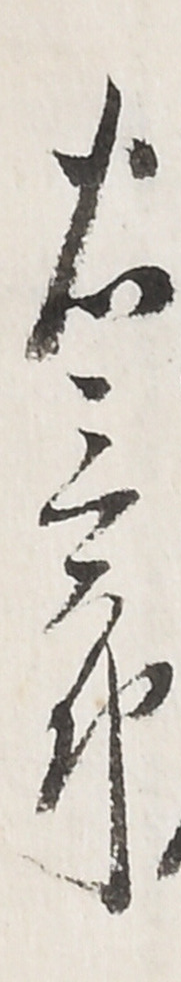忠三郎
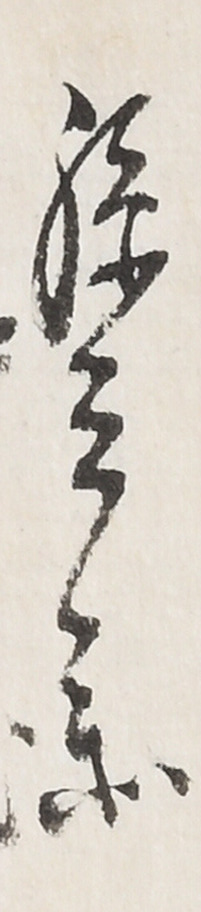治兵衛
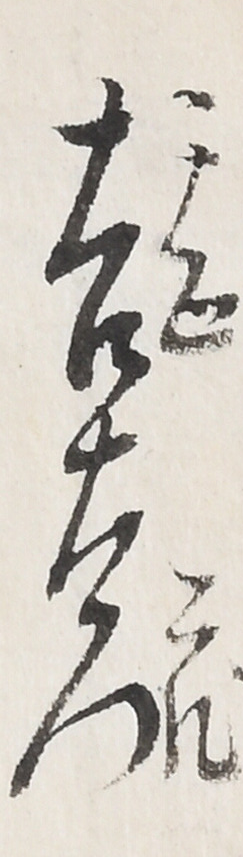吉右衛門
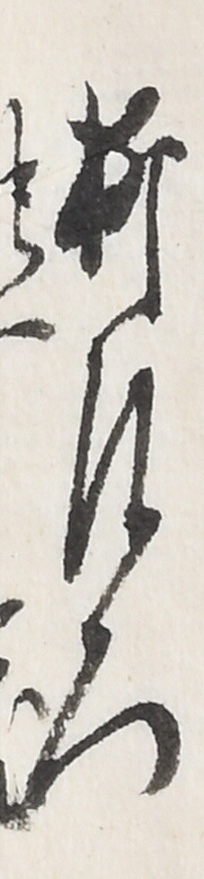吉左衛門
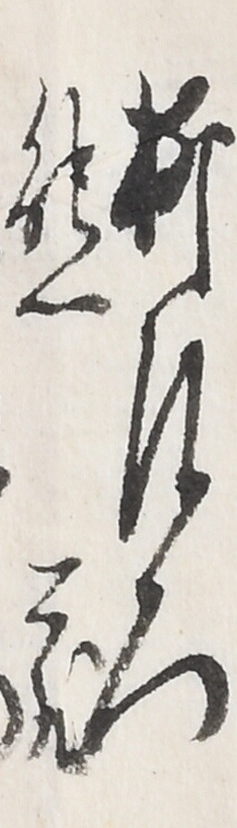重右衛門
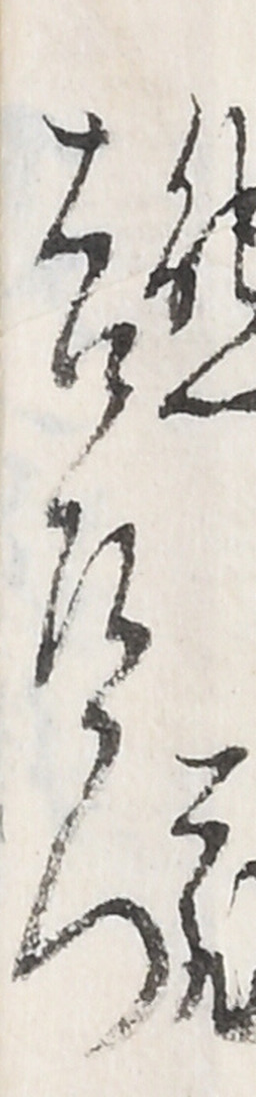吉左衛門
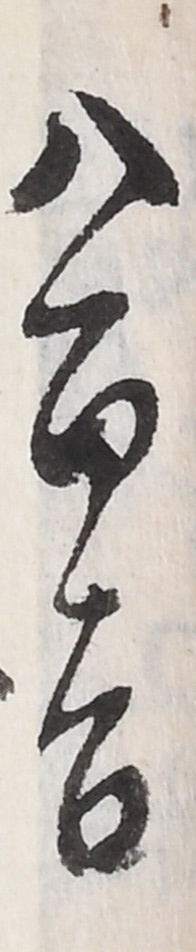八百吉
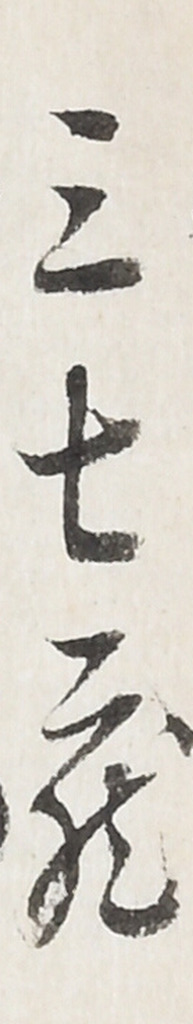三七蔵
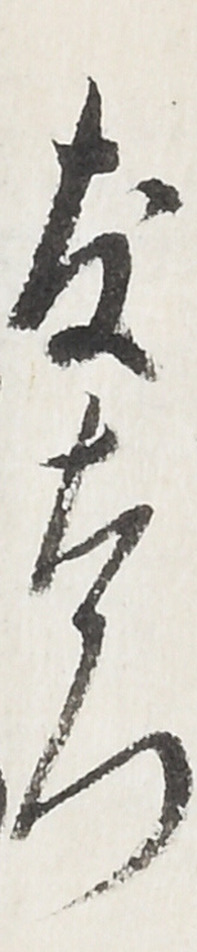重右衛門
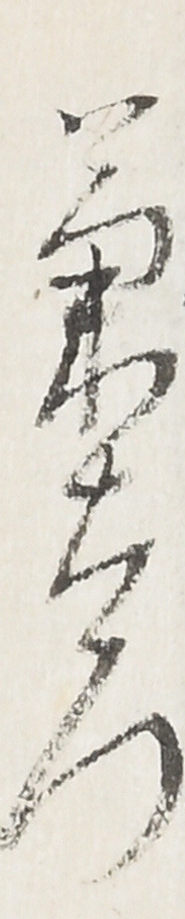重右衛門
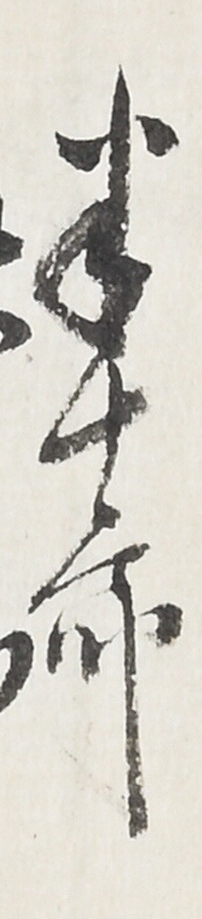半十郎
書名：御拝地百五拾年御祝儀献上御目録名前
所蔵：伊那市立高遠町図書館・合同会社AMANE
